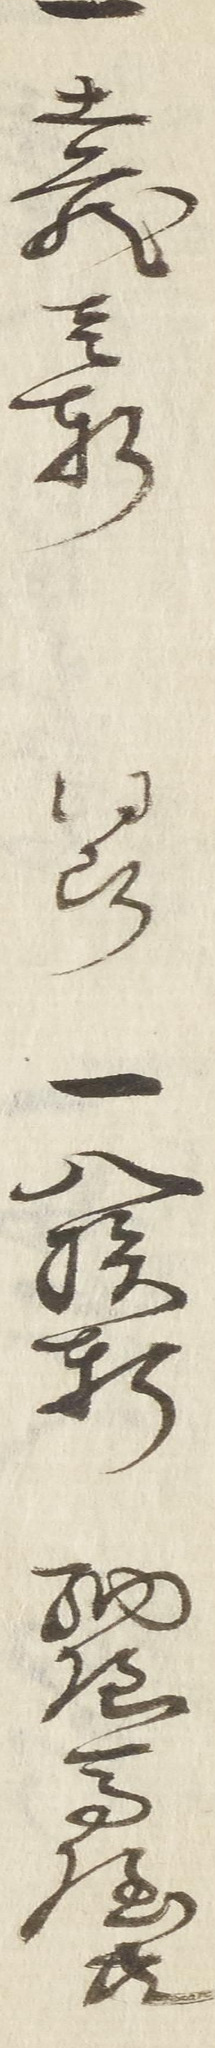一土蔵壱軒同断一八拾軒納屋馬屋共
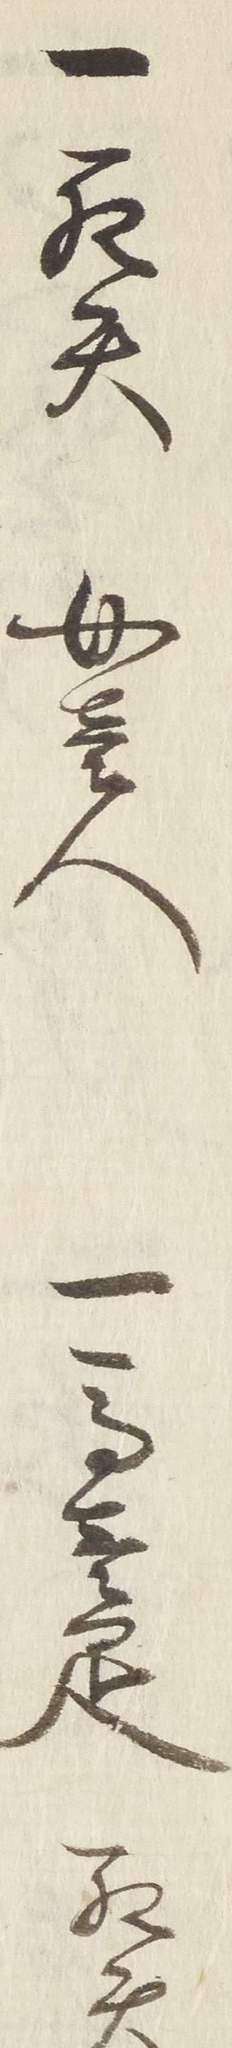一死失女壱人一馬壱疋死失
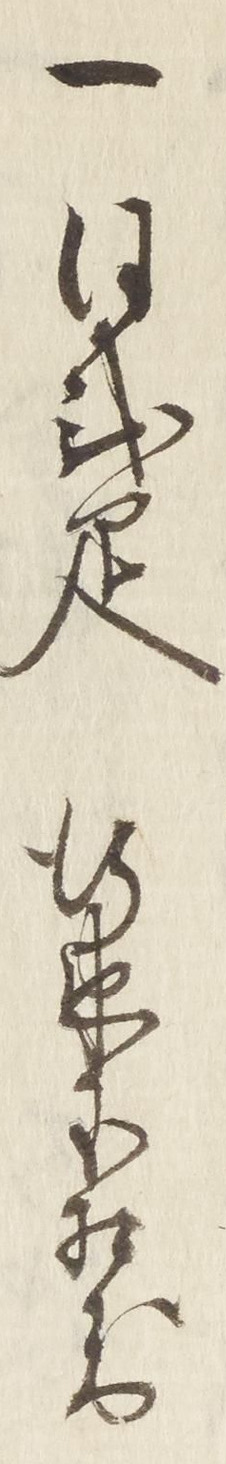一同弐疋行衛不相知
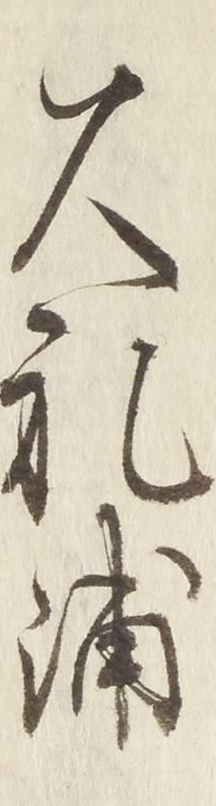大礼浦
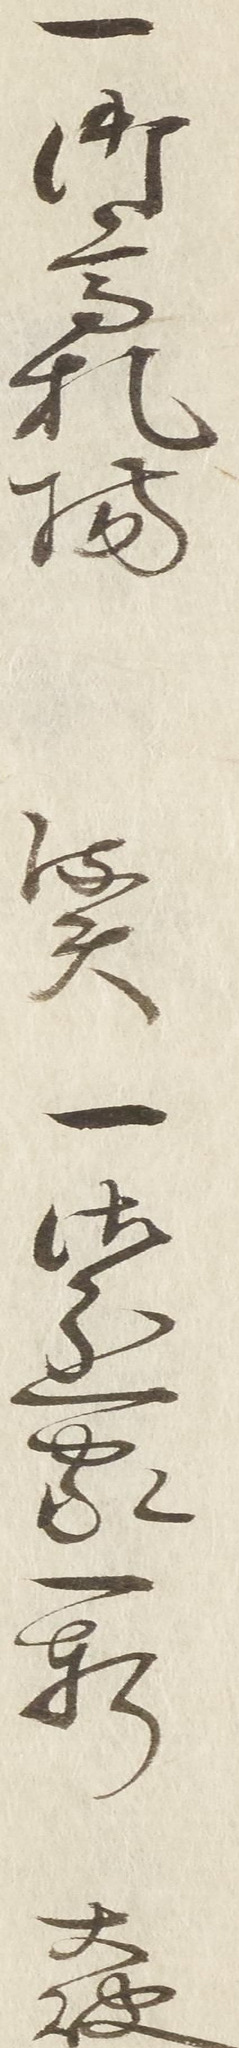一御高札場流失一御分一家一軒大破
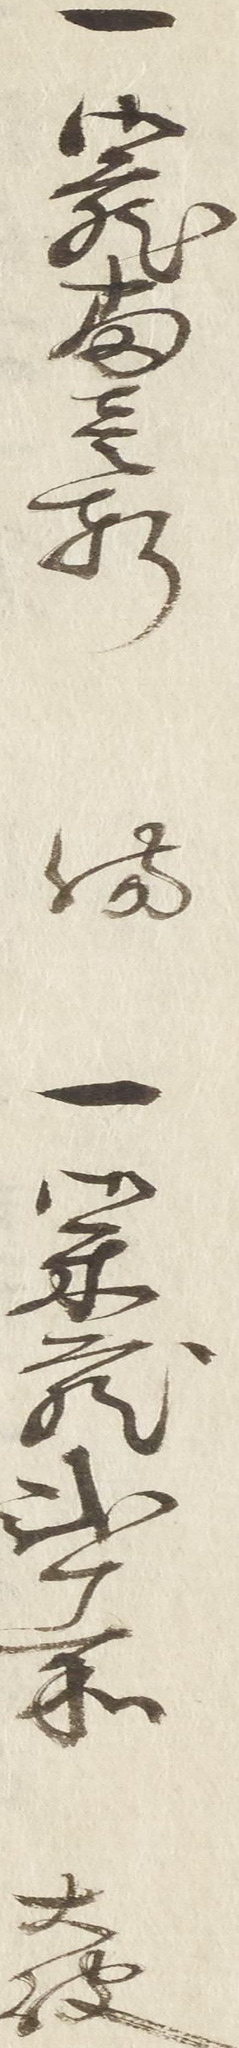一御蔵番壱軒傷一御米蔵弐ヶ所大破
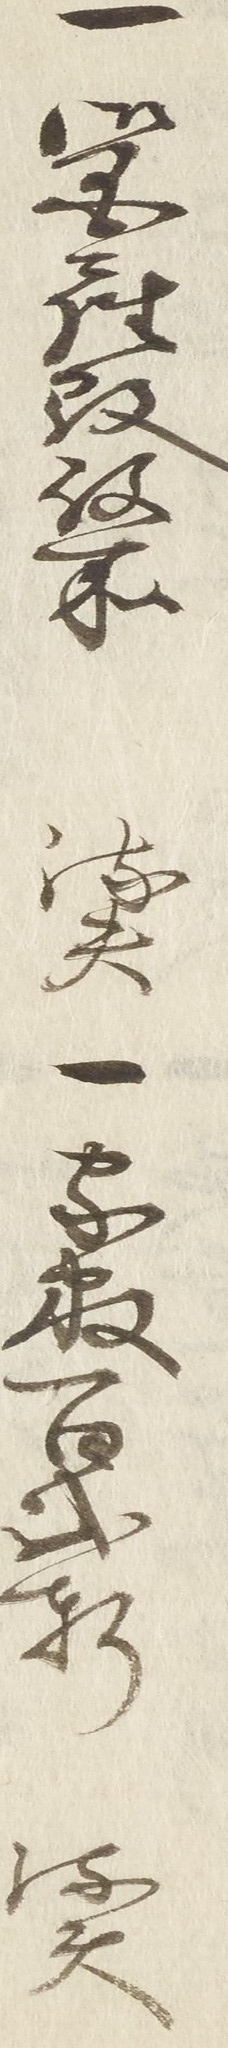一御国産改役所流失一家数百弐軒流失
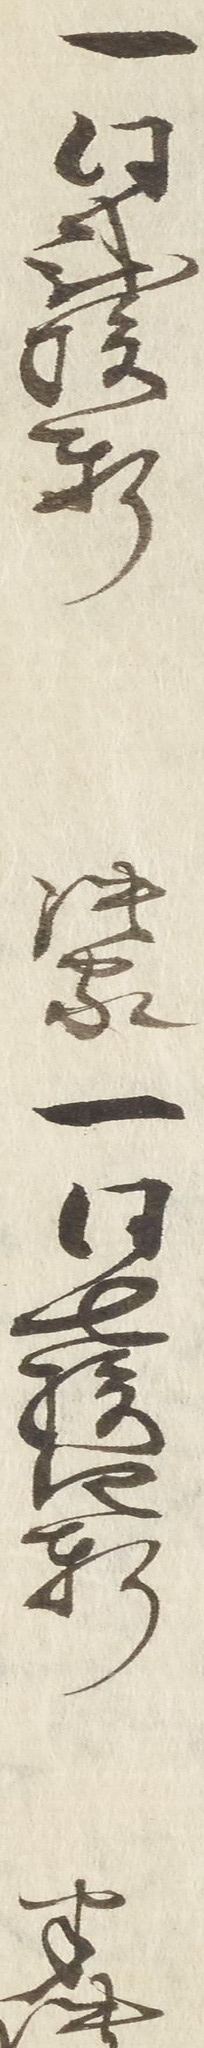一同弐拾軒潰家一同七拾四軒半潰
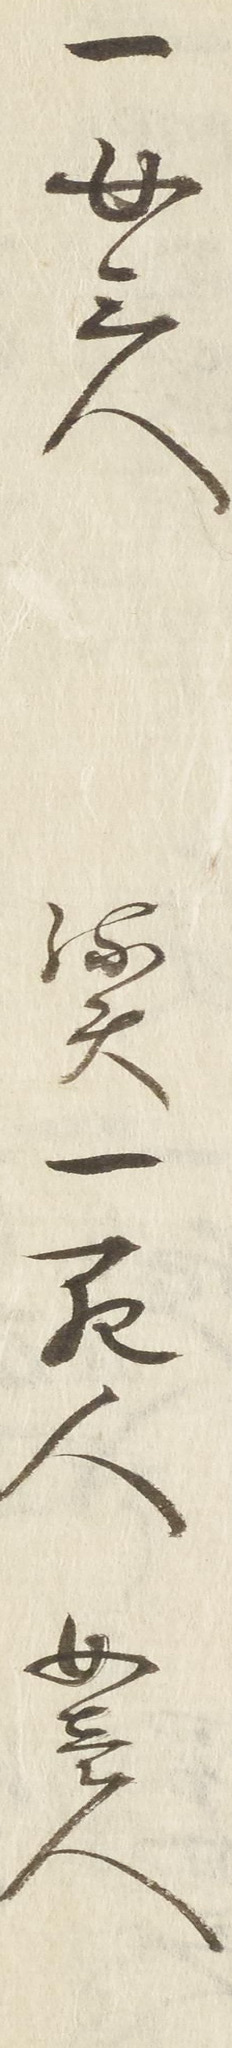一女三人流失一死人女壱人
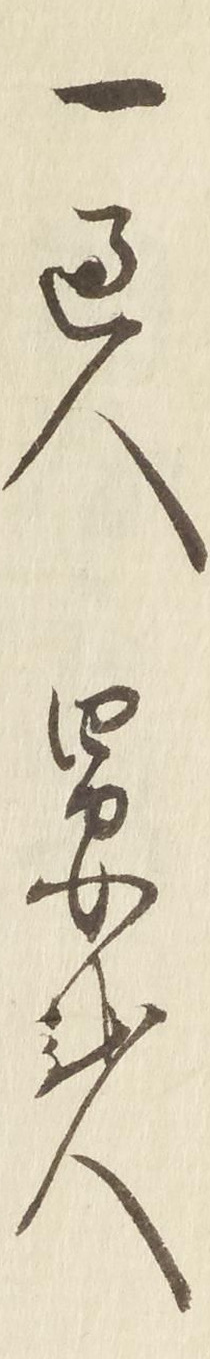一過人男女弐人
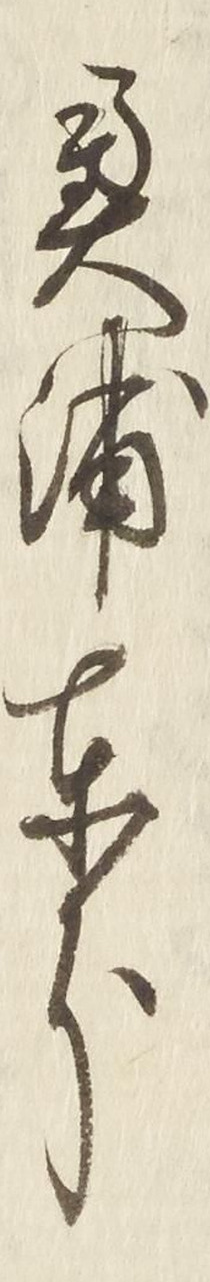奥浦東分
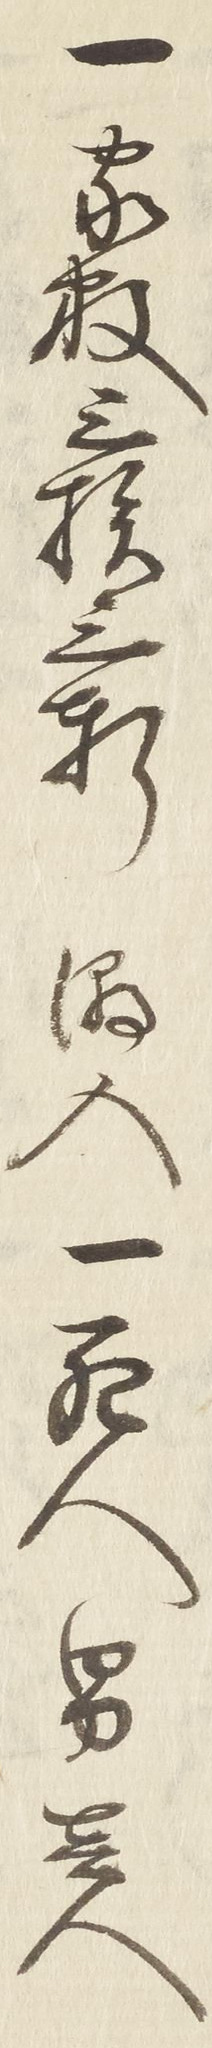一家数三拾三軒潮入一死人男壱人
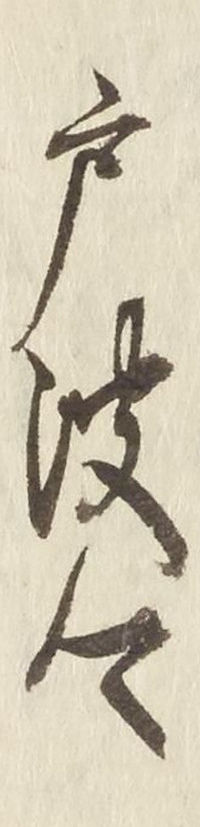戸波郷
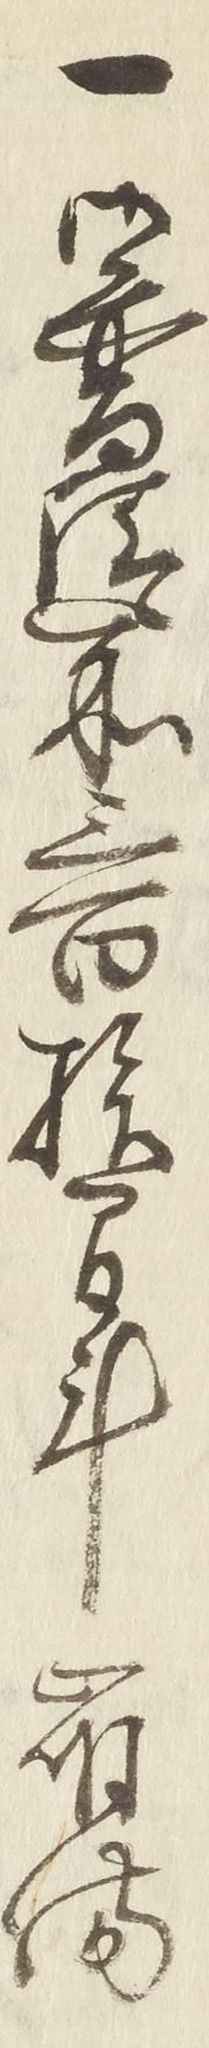一御普請所三百拾間斗崩傷
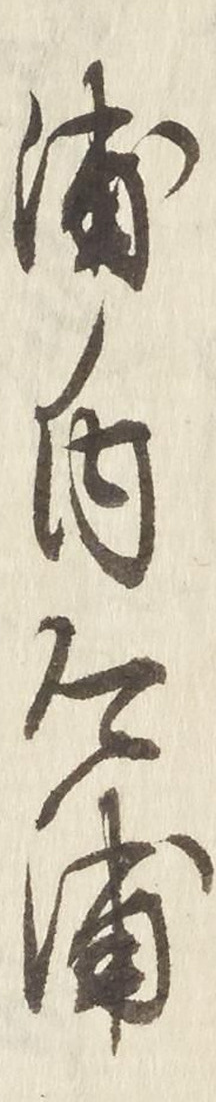浦ノ内郷浦
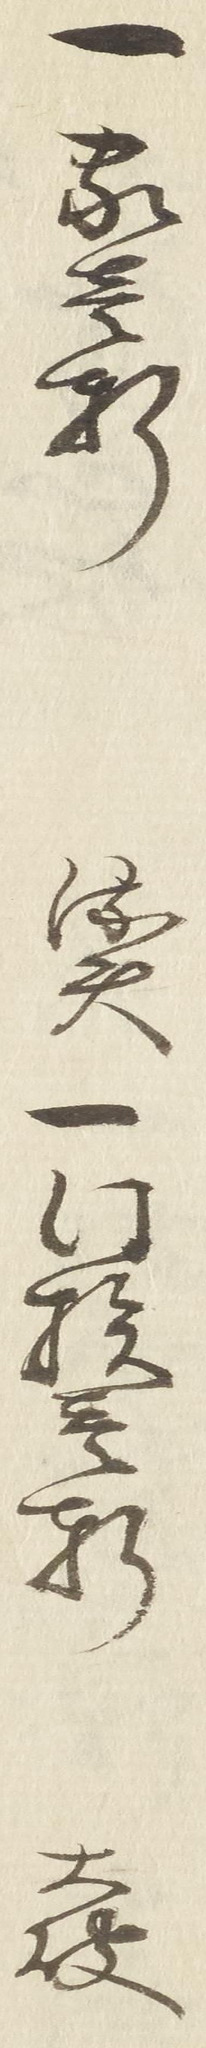一家壱軒流失一同拾壱軒大破
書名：地震記　下
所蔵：東京大学地震研究所図書室 Earthquake Research Institute Library, The University of Tokyo, JAPAN
